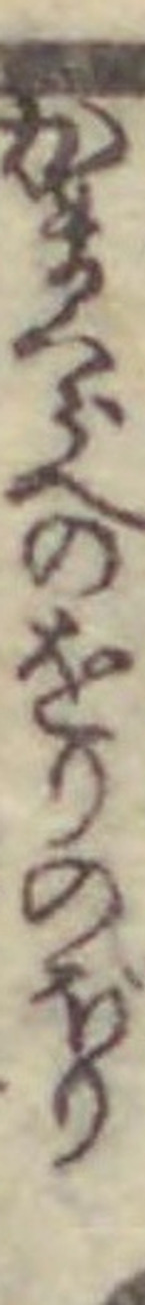かまくらへのをりのぼり
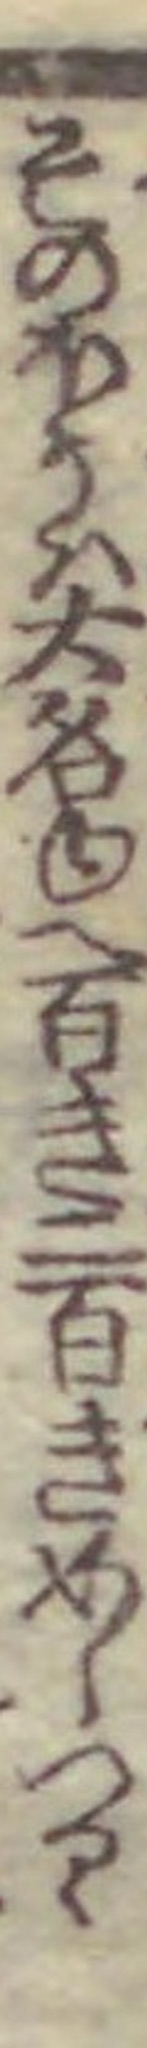そのほうは大名ゆへ百き二百きめしつるゝ
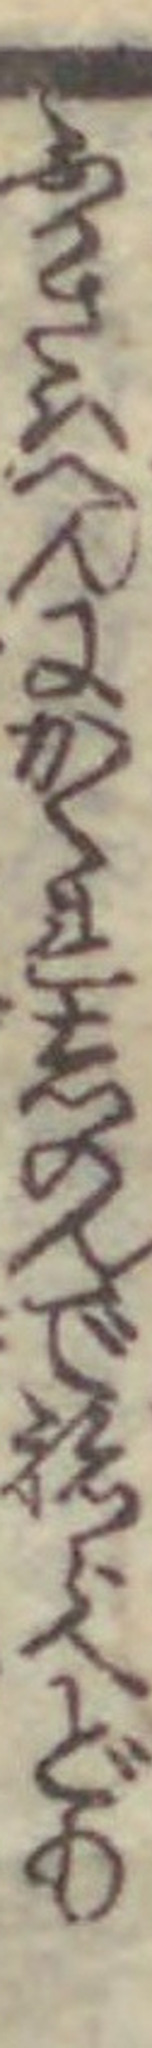ふかさはへんにかくれしのんでねらへども
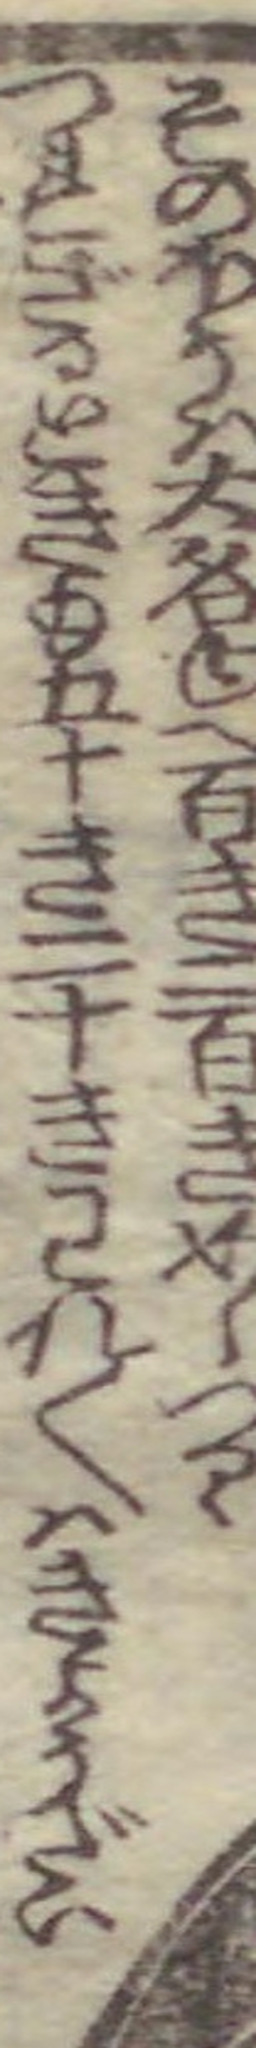つれざるときも五十き二十きわれ〳〵はきようだい
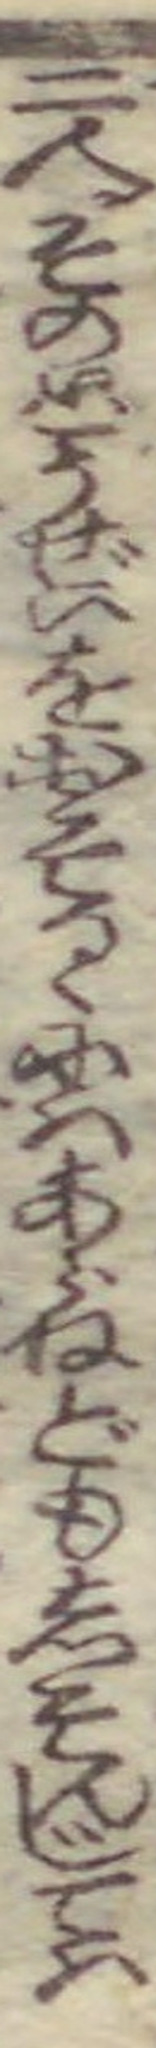二人そのとうぜいをおそるゝにはあらねどもしそんじては
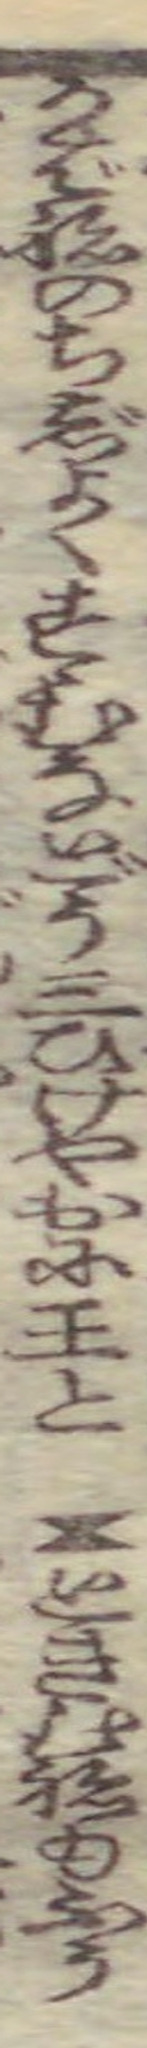かばねのちじよくすゝむなどう三ひけやおに王と
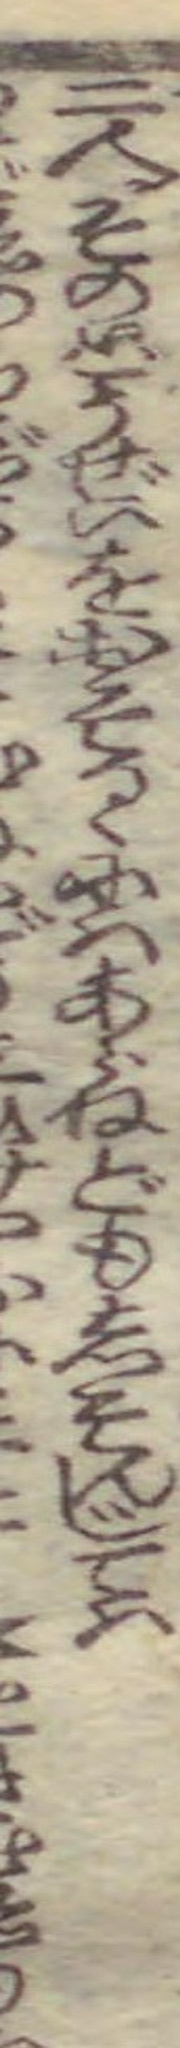二人そのとうぜいをおそるゝにはあらねどもしそんじては
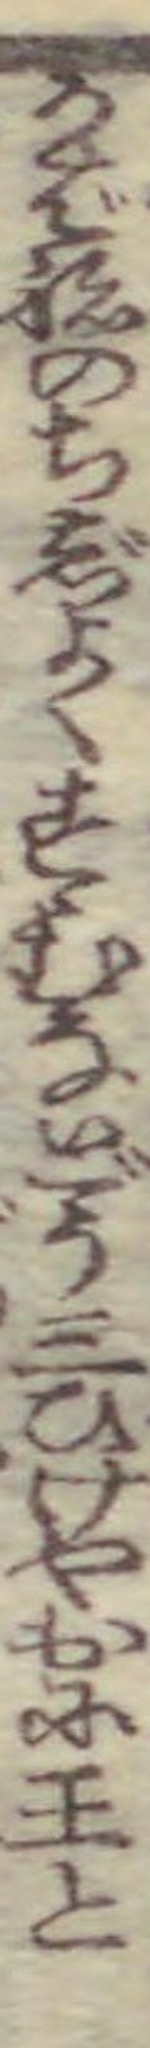かばねのちじよくすゝむなどう三ひけやおに王と
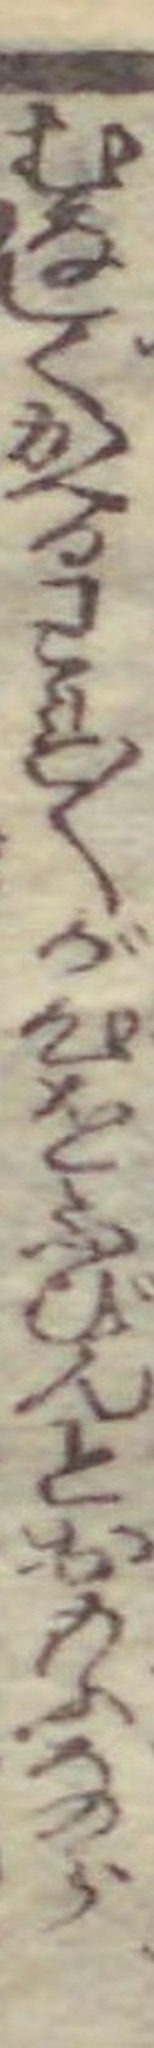むなしくかへるわれ〳〵が心をふびんとおもふなら
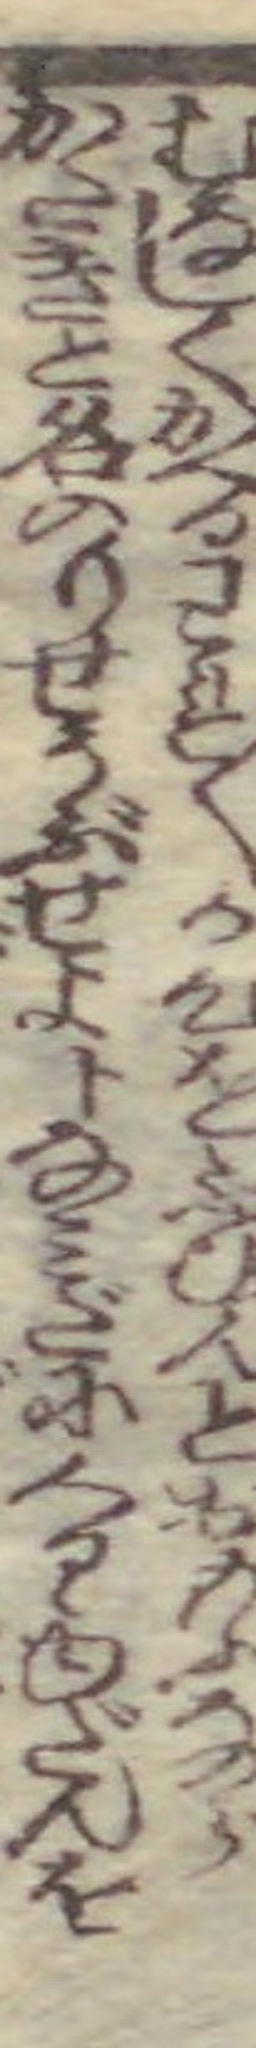かたきと名のりせうぶせよとなみだにくるゝゆだんを
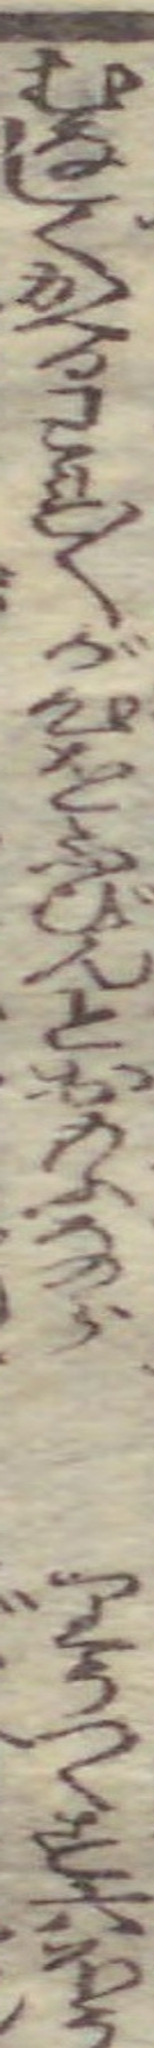むなしくかへるわれ〳〵が心をふびんとおもふなら
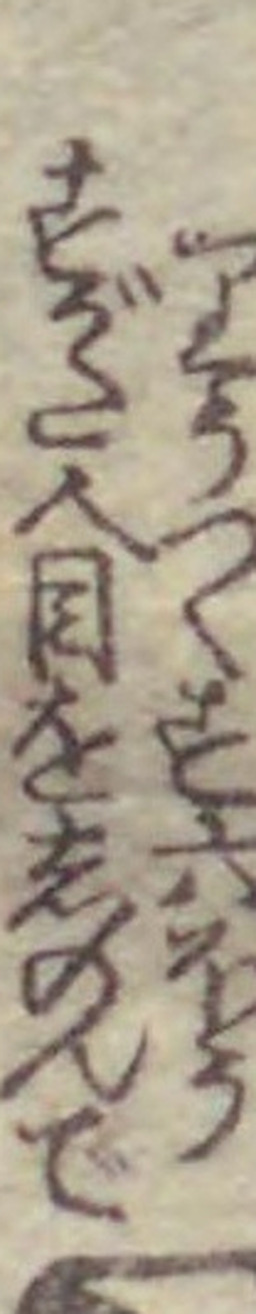すがた人目をしのんで
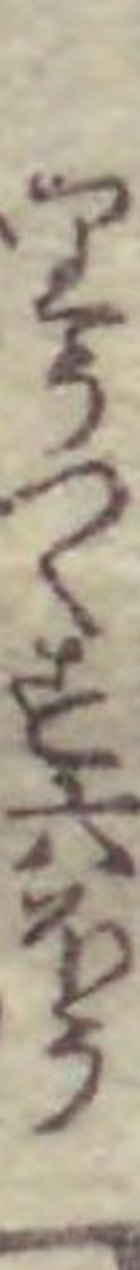りうつくす六ほう
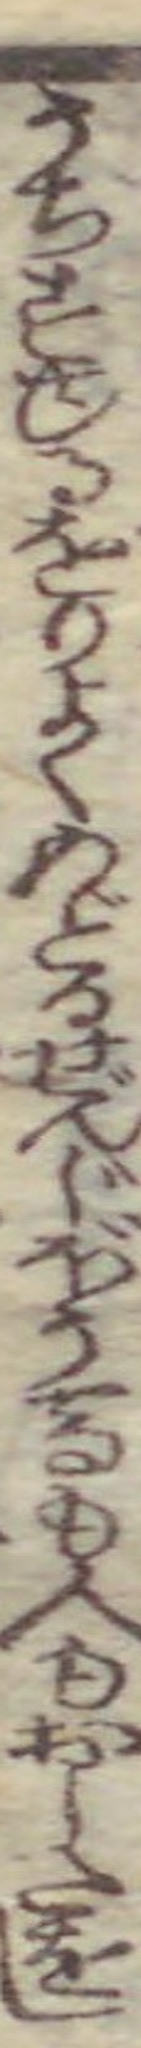うちすゆるをりよくもどるぜんじぼう馬も人もをしたをし
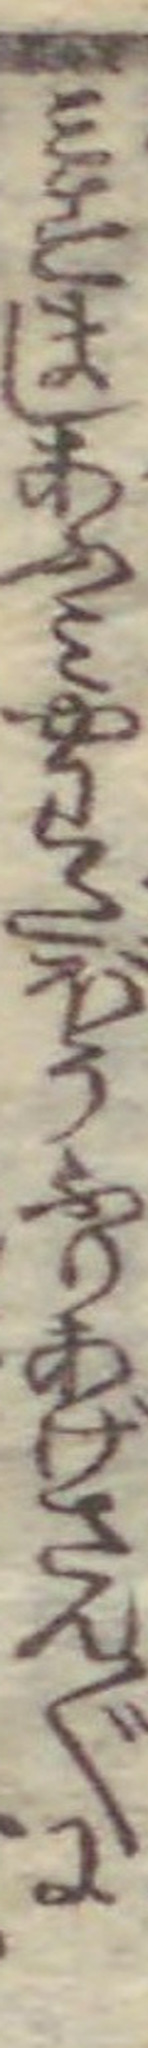みすましあふみやわたぼうふりあげさん〴〵に
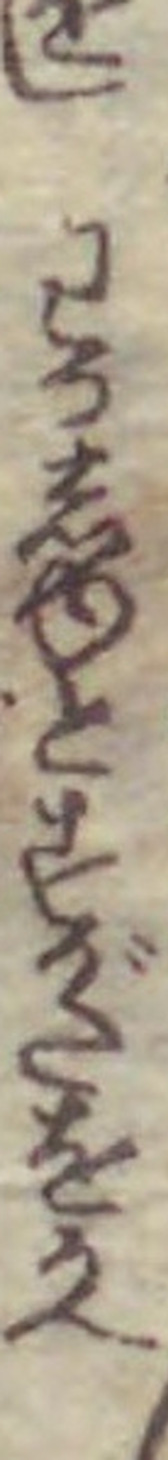わかしゆとすがたをかへ
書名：大時代唐土化物 3巻. 曽我太夫染
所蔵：国立国会図書館 National Diet Library, JAPAN
